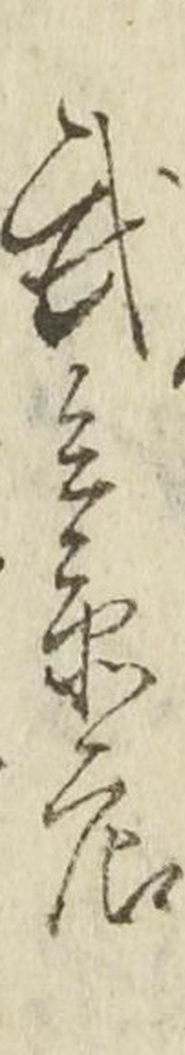武兵衛店
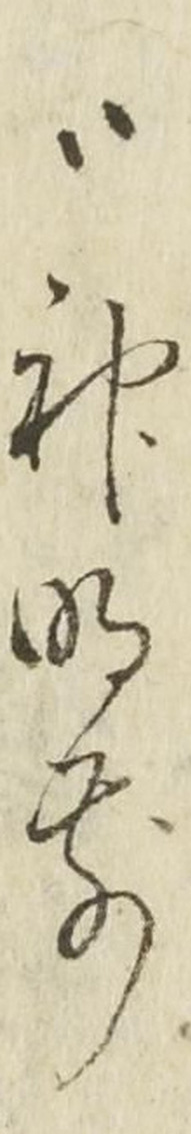同神明前
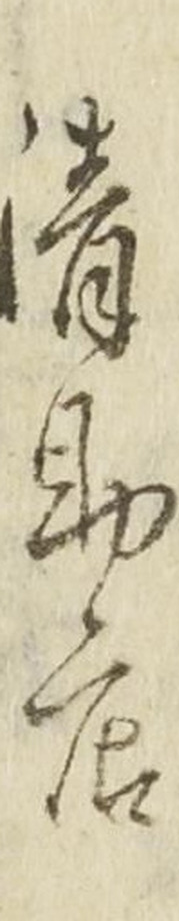清助店
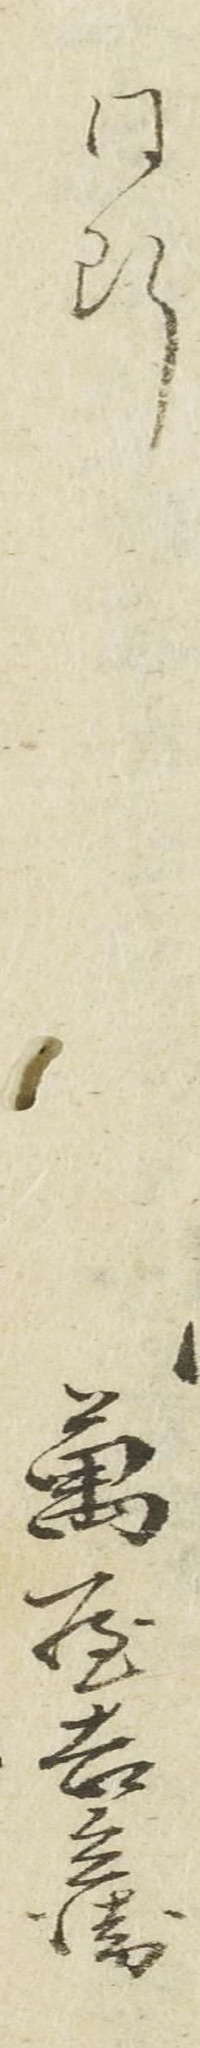同断萬屋吉兵衛
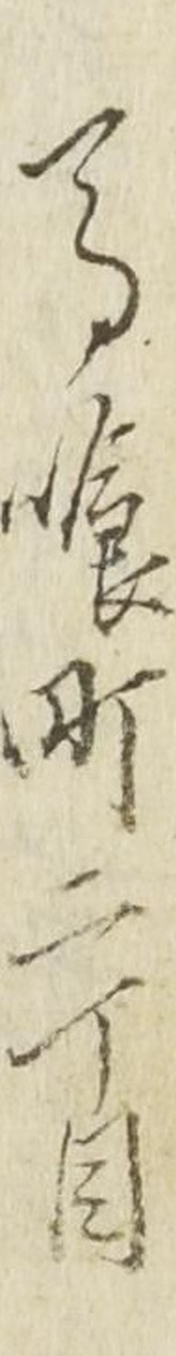馬喰町二丁目
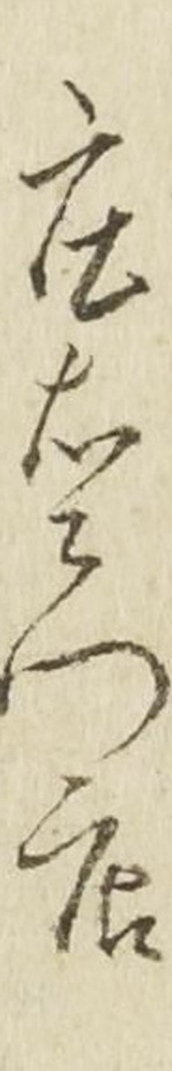庄右衛門店
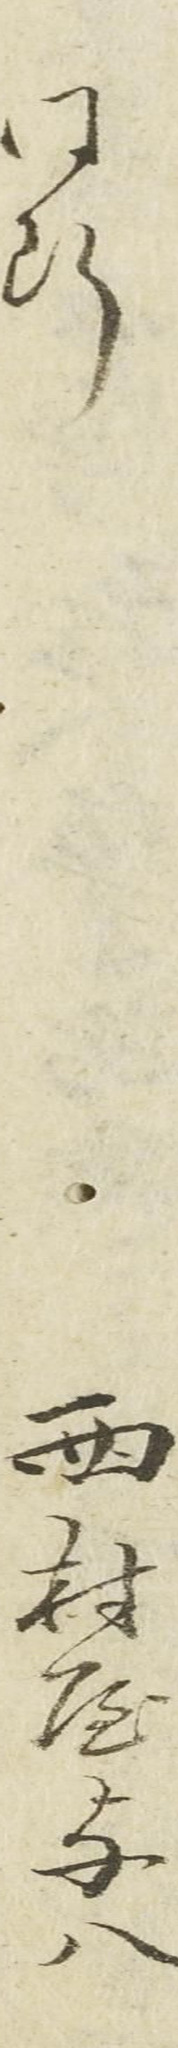同断西村屋与八
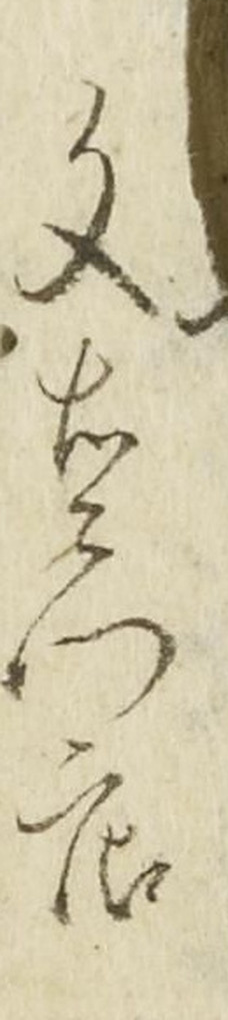文右衛門店
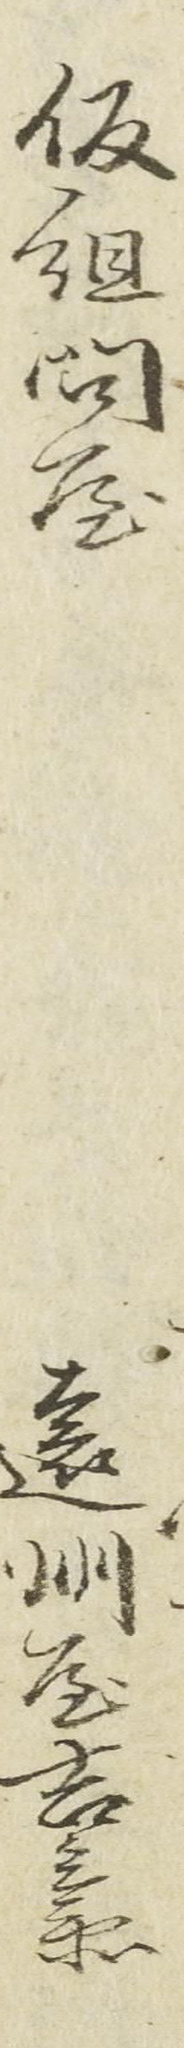仮組問屋遠州屋吉兵衛
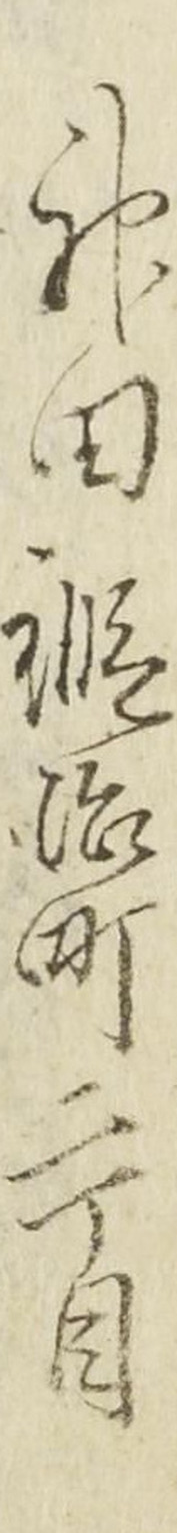神田鍛冶町二丁目
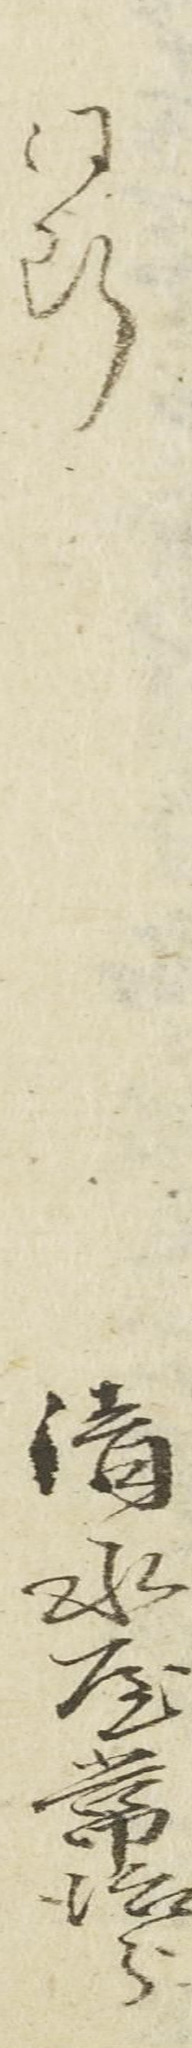同断清水屋常治郎
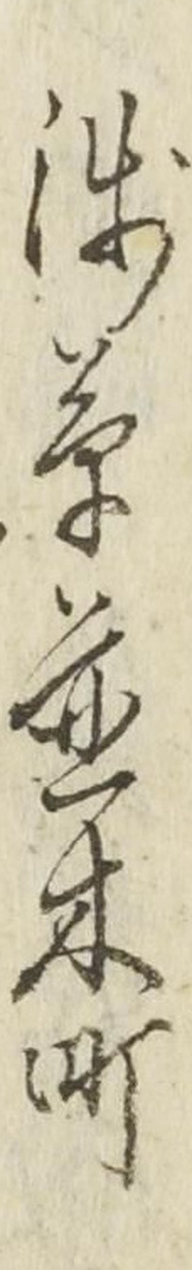浅草並木町
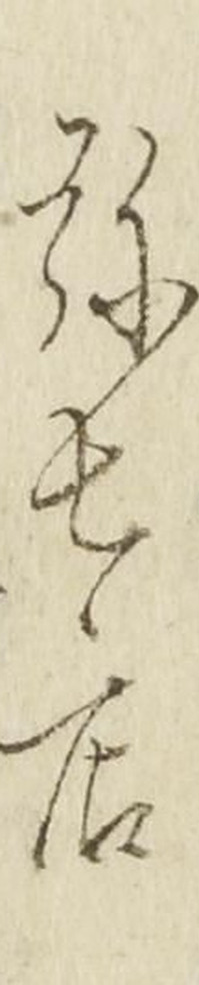弥七店
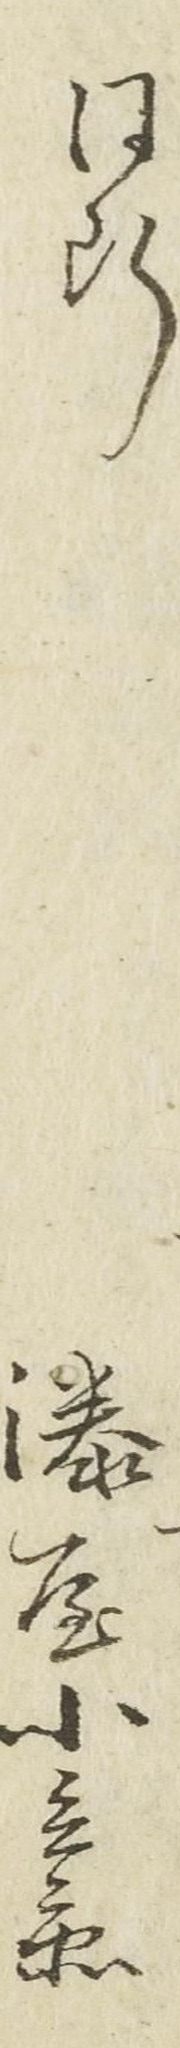同断湊屋小兵衛
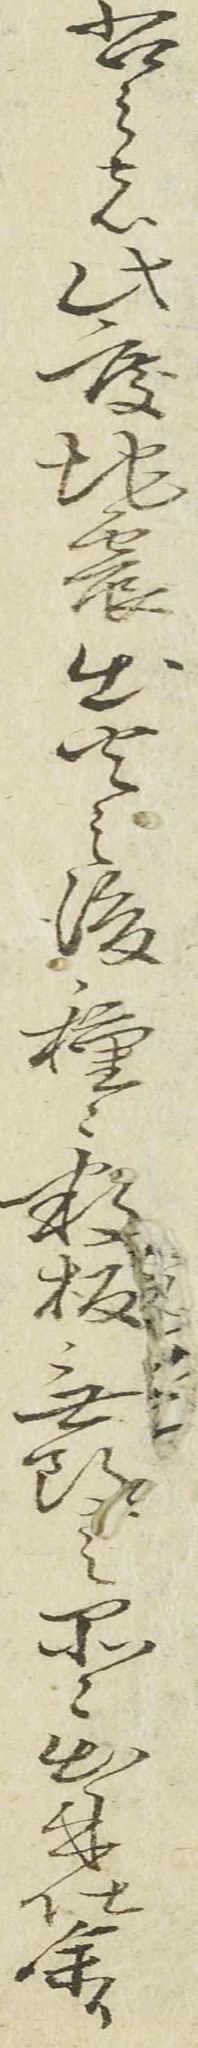右之者此度地震出火之後種々数板無断之品々出来仕余り
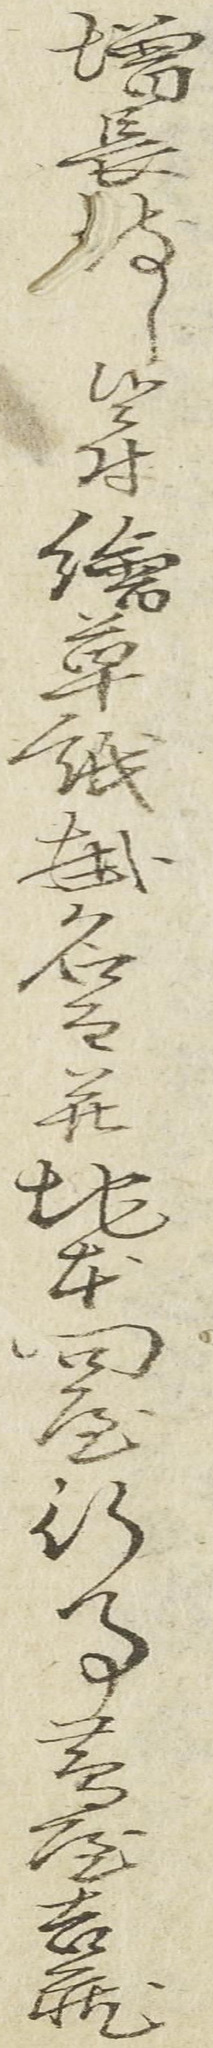増長致し候ニ付絵草紙掛名主幷地本問屋行事蔦屋吉蔵
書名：安政二乙卯年十月二日大地震之事
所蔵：東京大学地震研究所図書室 Earthquake Research Institute Library, The University of Tokyo, JAPAN
